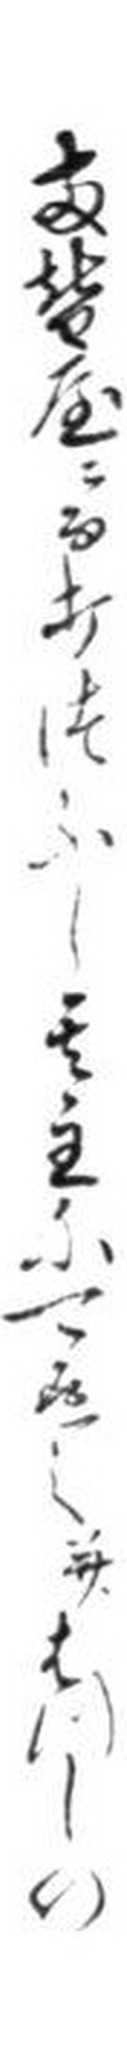両替屋ニ而打つふし其主に可返之并はつしの
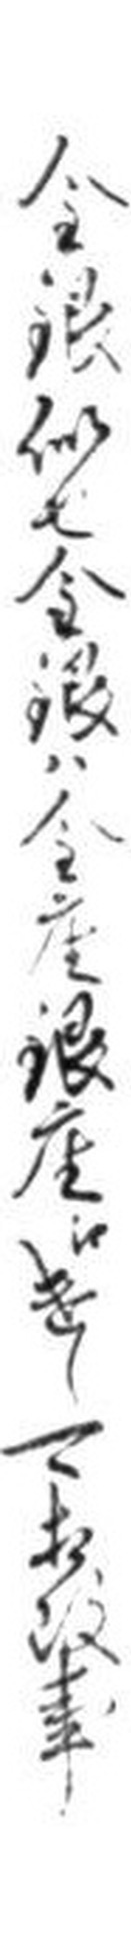金銀似せ金銀ハ金座銀座江遣し可相改事
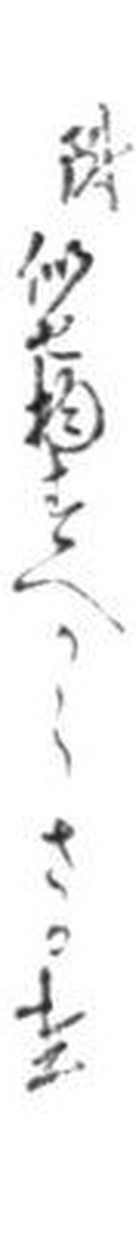附似せ物すへからさる事
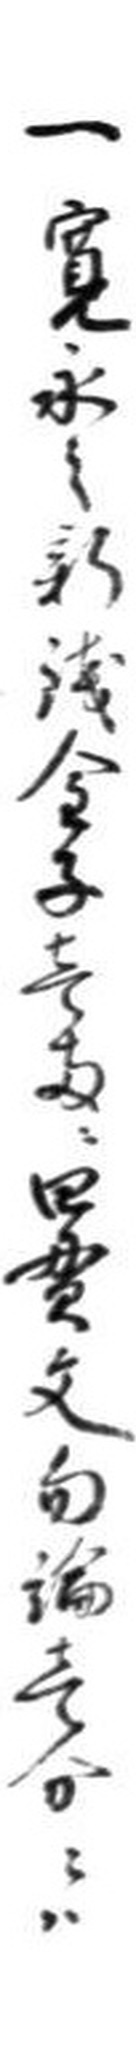一寛永之新銭金子壱両ニ四貫文勿論壱分ニハ
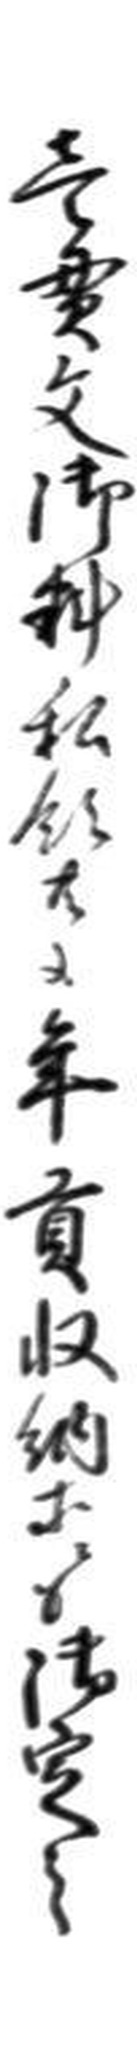壱貫文御料私領共に年貢収納等ニも御定之
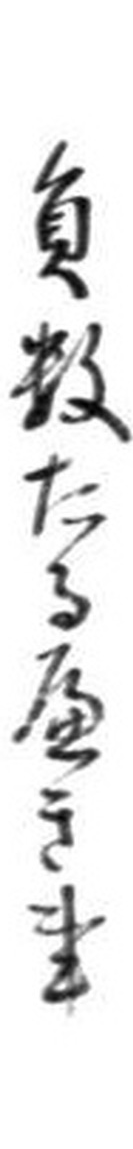員数たるへき事
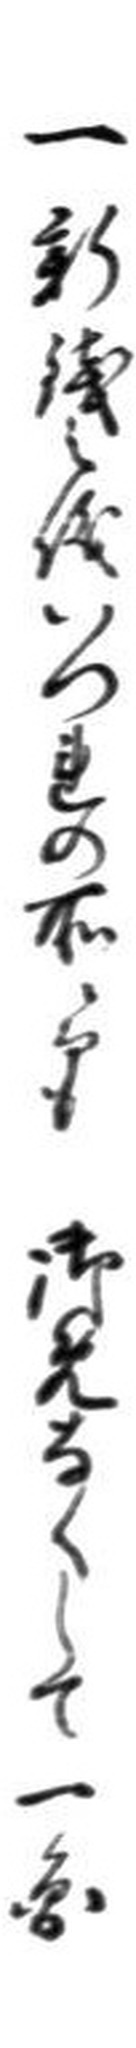一新銭之儀いつれの所ニ而も御免なくして一円
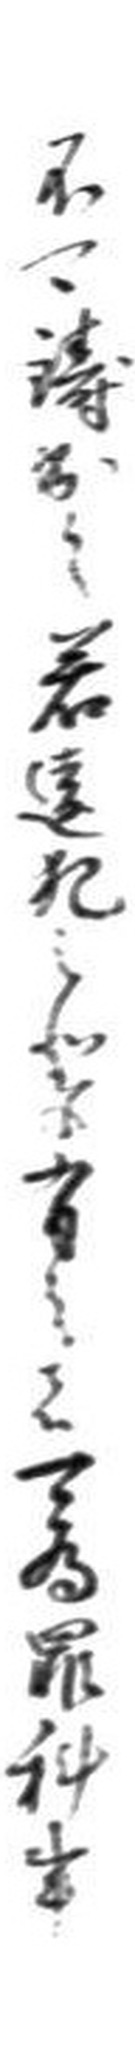不可鋳出之若違犯之輩有之者可為罪科事
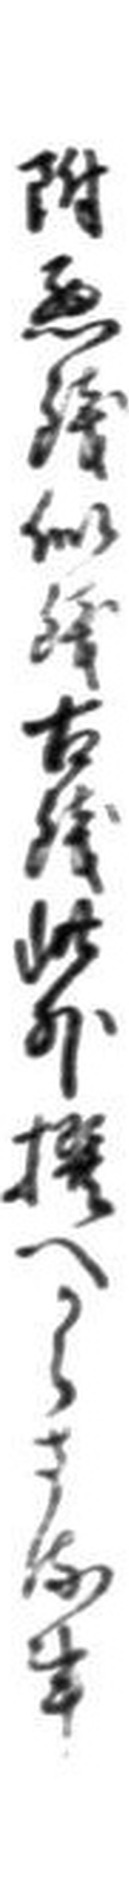附悪銭似銭古銭此外撰へからさる事
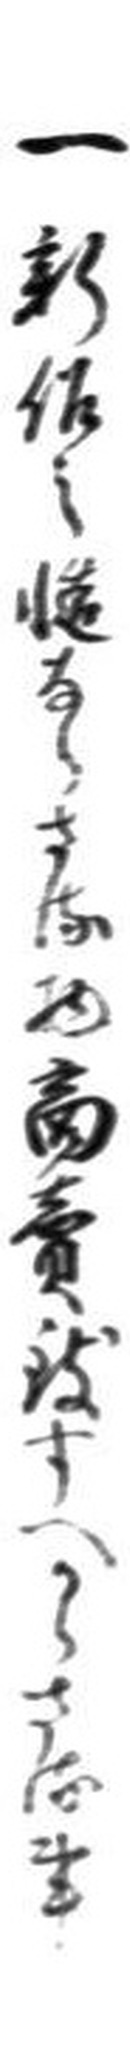一新作之慥ならさる物商売致すへからさる事
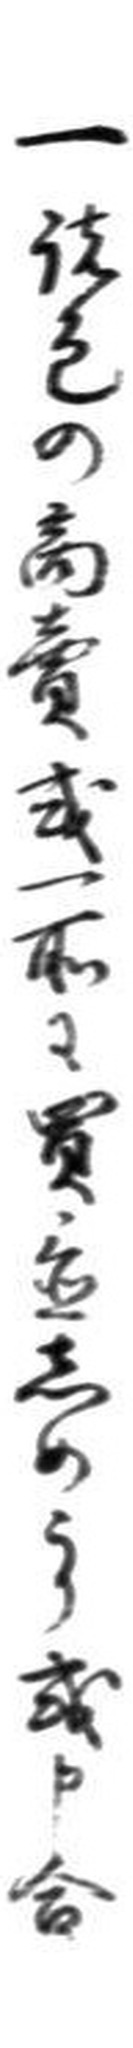一諸色の商売或一所に買置しめうり或申合
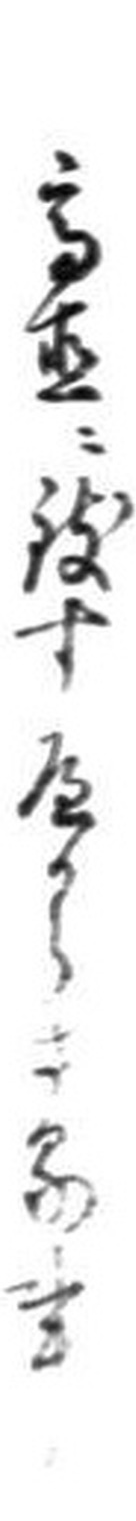高直ニ致すへからさる事

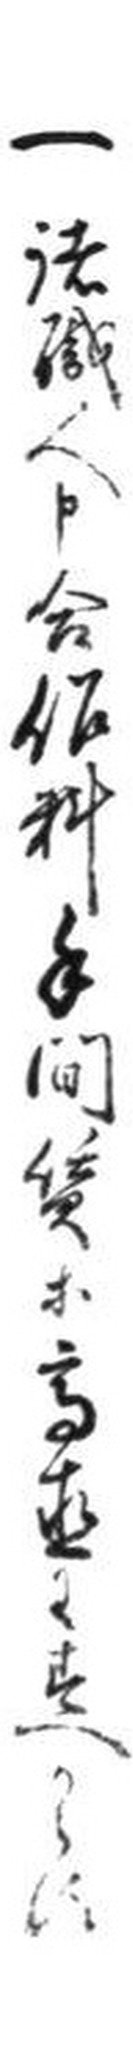一諸職人申合作料手間賃等高直にすへからす
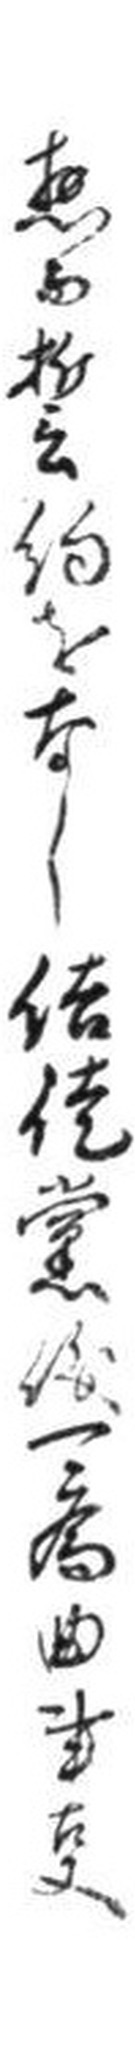惣而誓約をなし結徒党儀可為曲事事
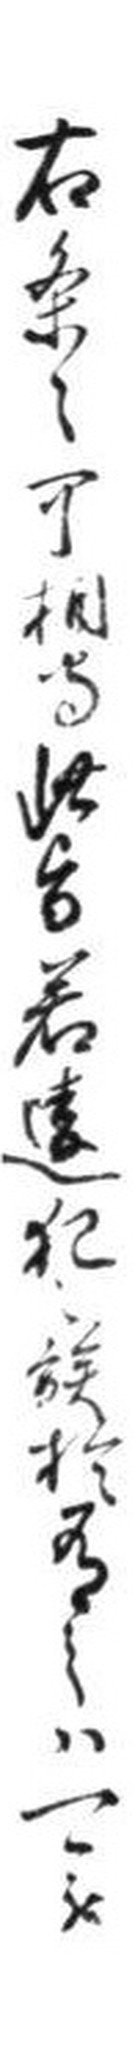右条々可相守此旨若違犯之族於有之ハ可被
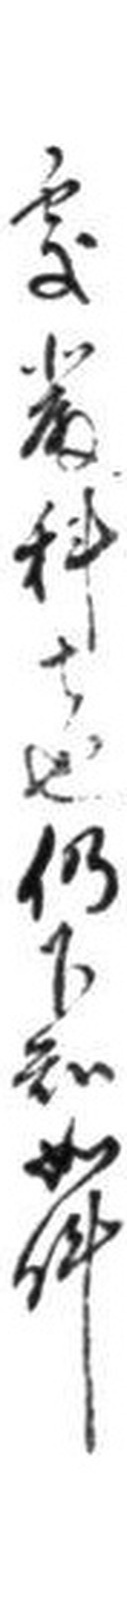処厳科者也仍下知如件
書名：家譜 十五 綱昌公 従天和元年到元禄十二年
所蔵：福井県文書館 Fukui Prefectural Archives
